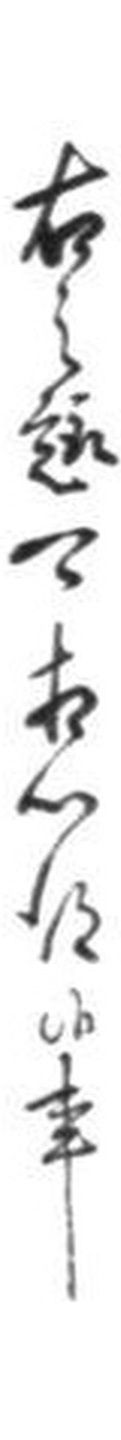右之趣可相心得候事
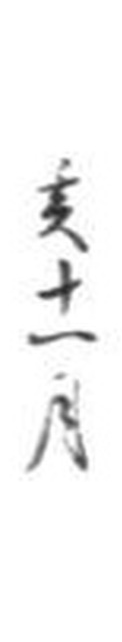亥十一月
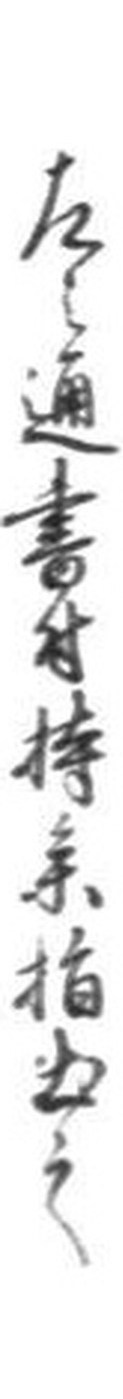左之通書付持参指出之
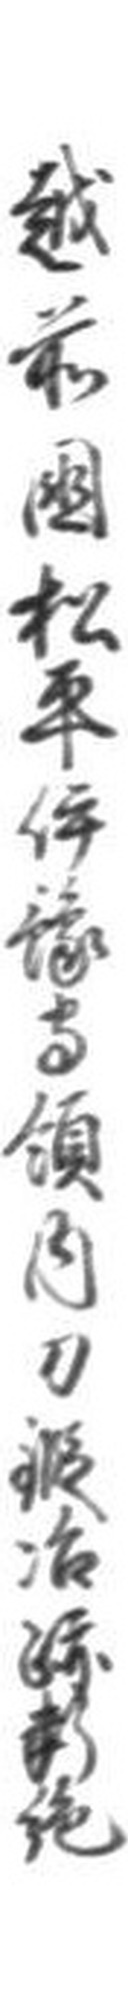越前国松平伊予守領内刀鍛冶跡断絶
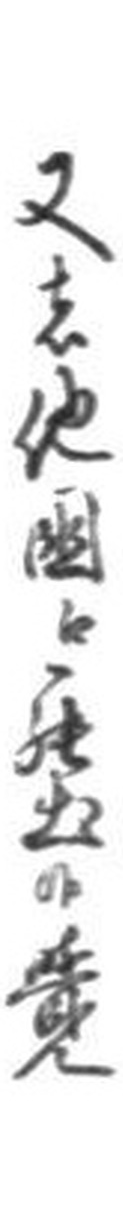又者他国江罷出候覚
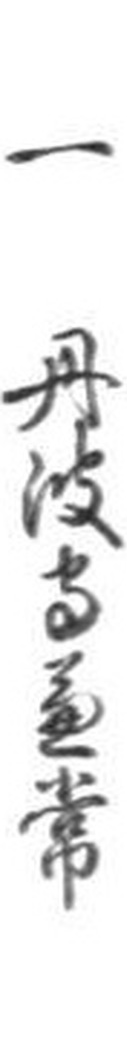一丹波守兼常
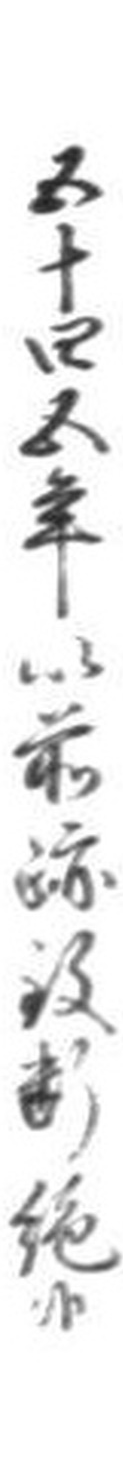五十四五年以前跡断絶候
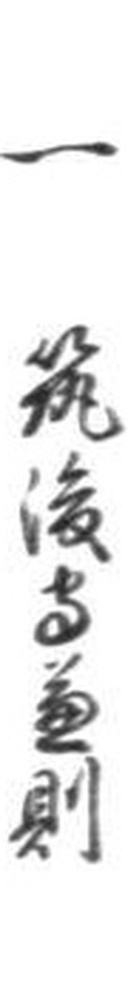一筑後紙兼則

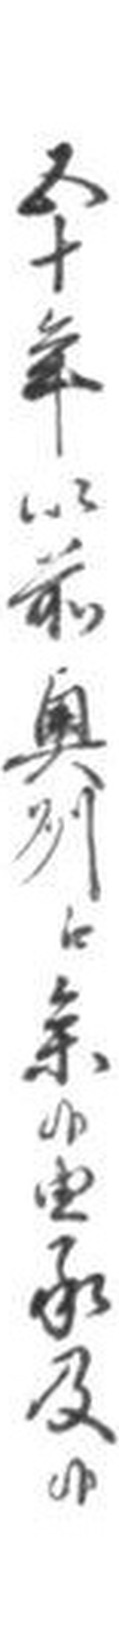五十年以前奥州江参候由承及候
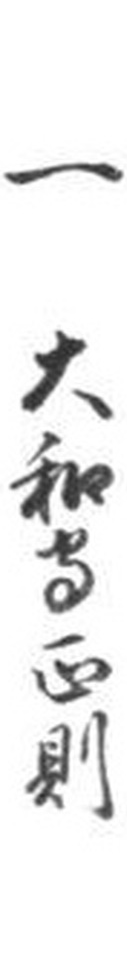一大和守正則
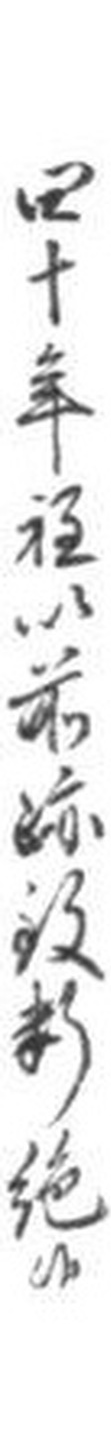四十年程以前跡致断絶候
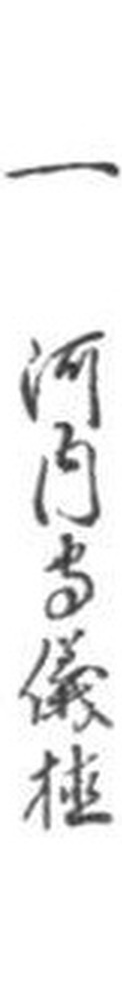一河内守儀植
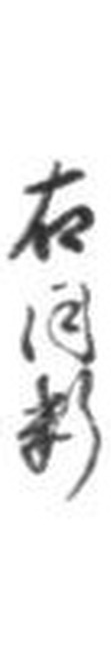右同断
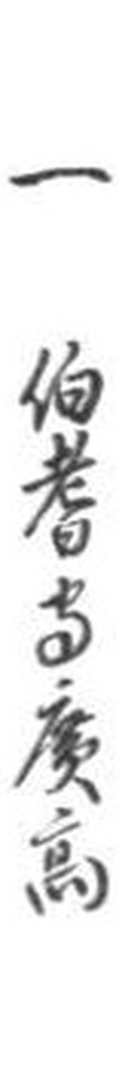一伯耆守広高
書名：家譜 三十三 吉邦公 享保四年
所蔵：福井県文書館 Fukui Prefectural Archives
